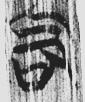命（令）
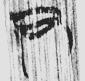尹
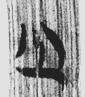少
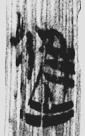進
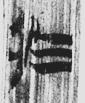於
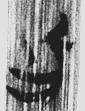此
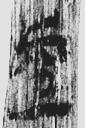○（吾）
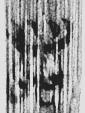○（一）
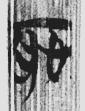恥
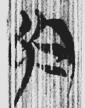於
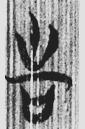告
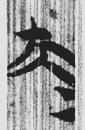夫
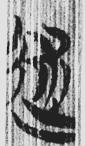述（遂）
